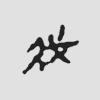伐
